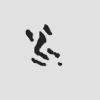水
